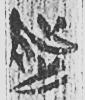陟
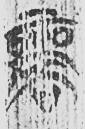商
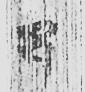邑
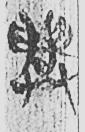興
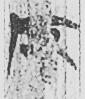反
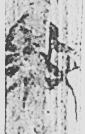殺
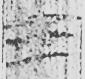三
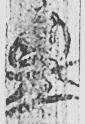監
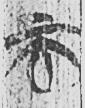而
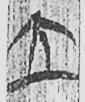立
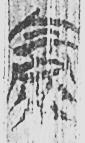{宀彔}
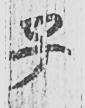子
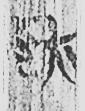耿
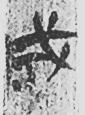成
